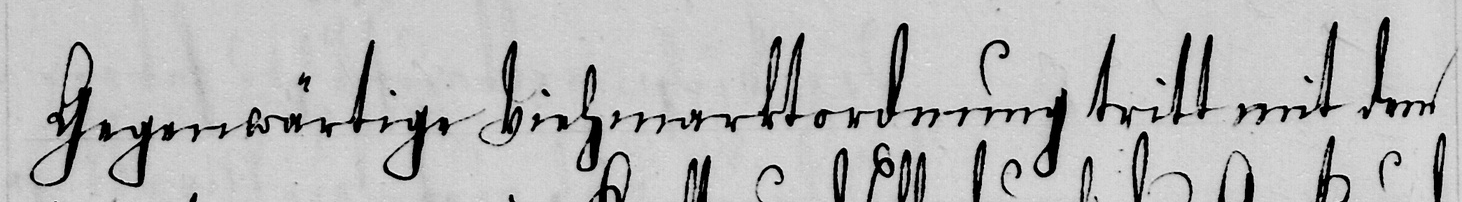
Gegenwärtige Viehmarktsordnung tritt mit dem
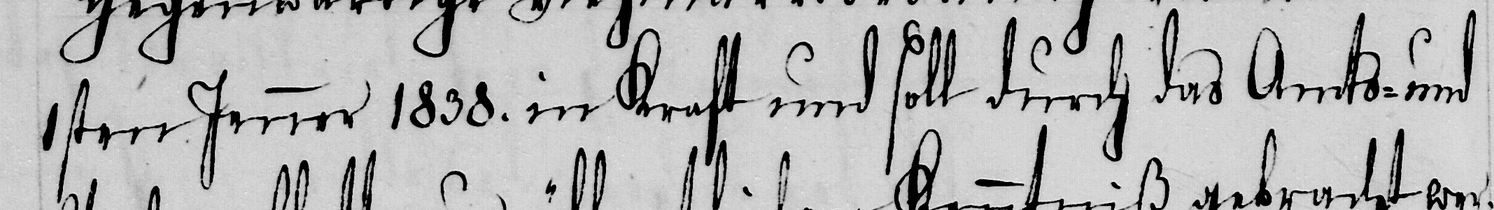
1sten Jenner 1838. in Kraft und soll durch das Amts- und
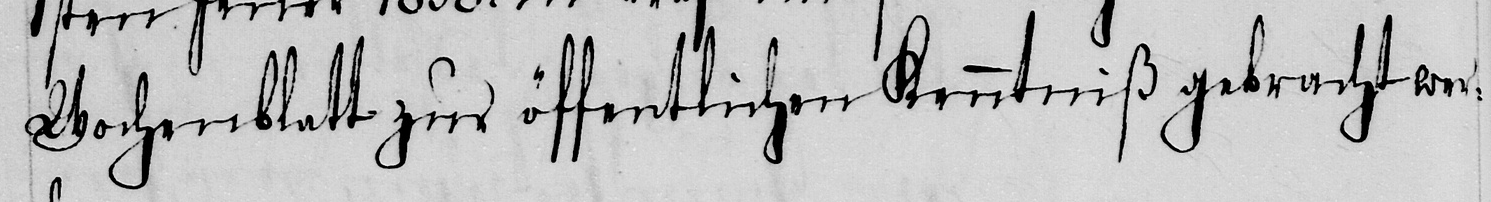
Wochenblatt zur öffentlichen Kenntniß gebracht we¬
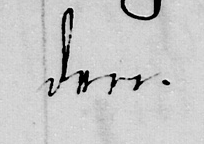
rden.
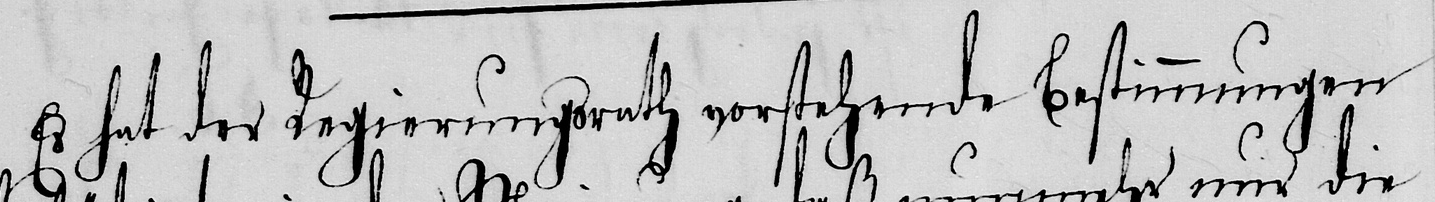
Es hat der Regierungsrath vorstehende Bestimmungen
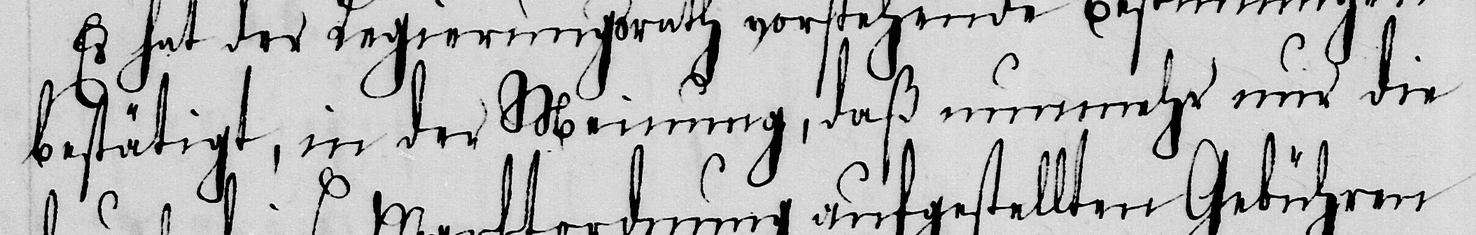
bestätigt, in der Meinung, daß nunmehr nur die
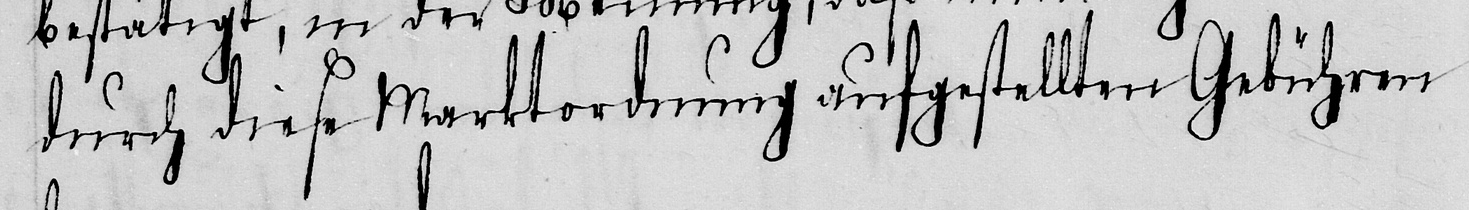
durch diese Marktordnung aufgestellten Gebühren
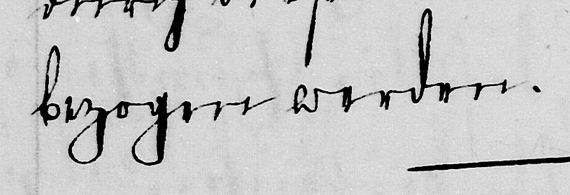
bezogen werden.
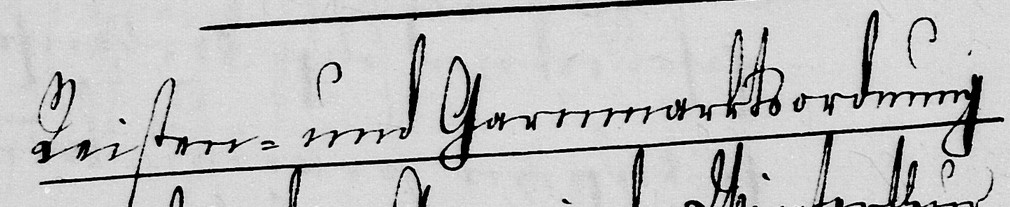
Reisten- und Garnmarktsordnung
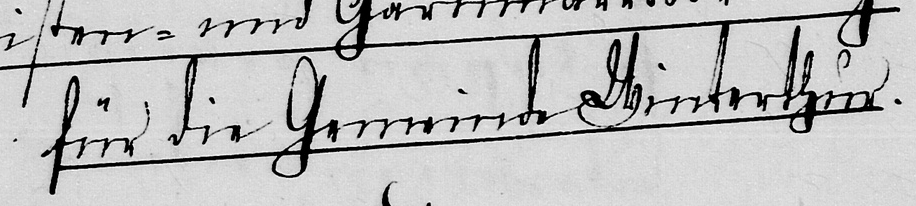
für die Gemeinde Winterthur.
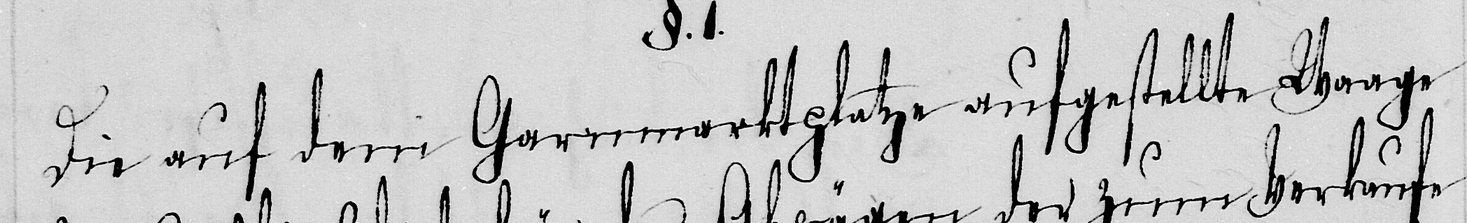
Die auf dem Garnmarktplatze aufgestellte Waage
